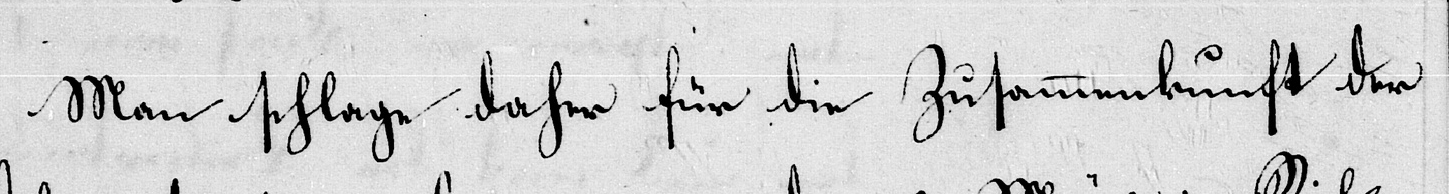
Man schlage daher für die Zusammenkunft der
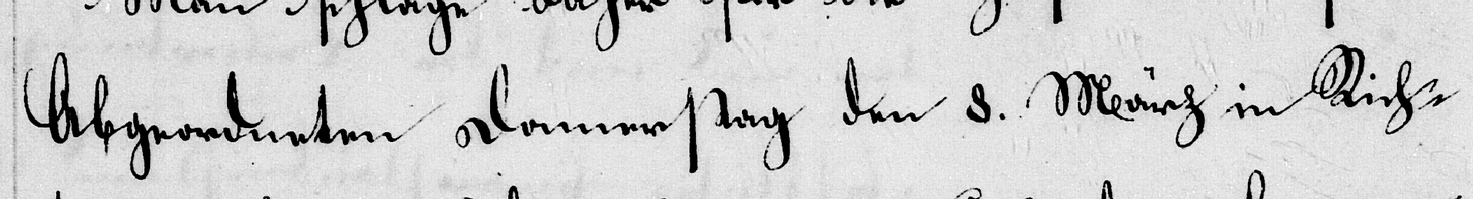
Abgeordneten Donnerstag den 8. März in Rich¬
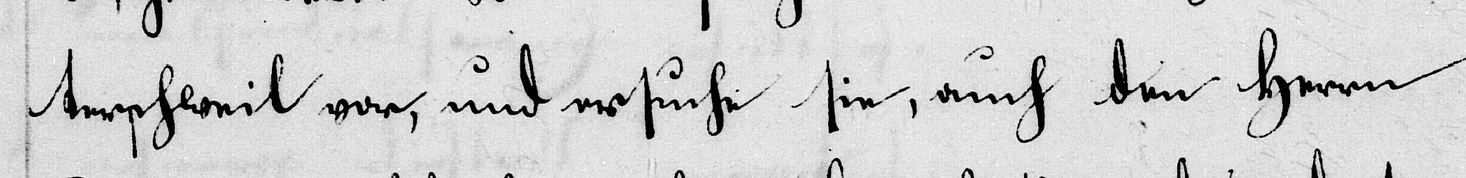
terschweil vor, und ersuche sie, auch den Herrn
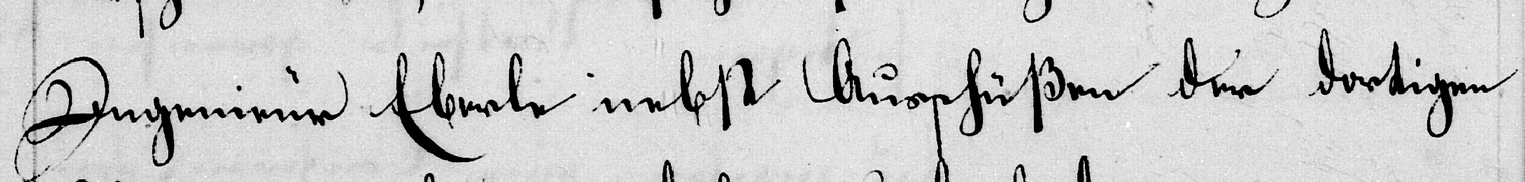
Ingenieur Eberle nebst Ausschüßen der dortigen
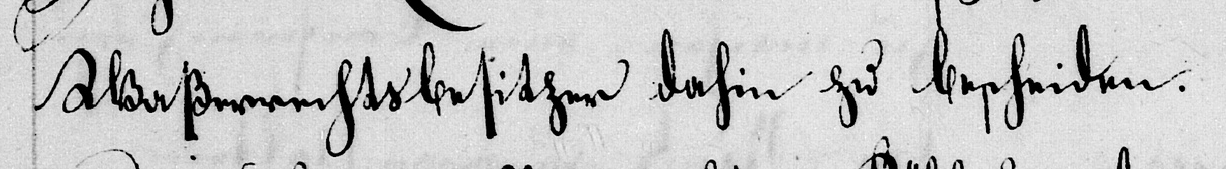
Waßerrechtsbesitzer dahin zu bescheiden.
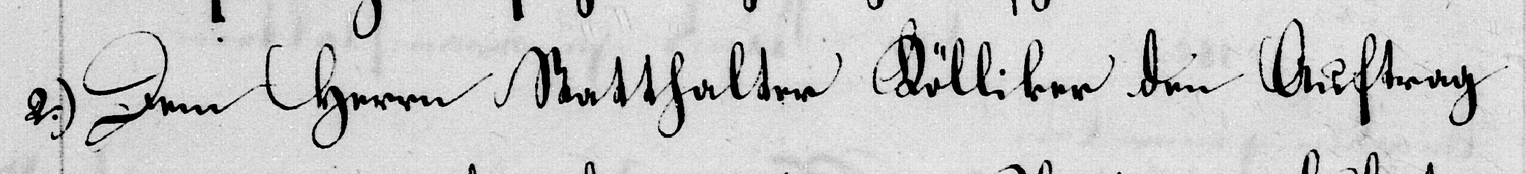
2.) Dem Herrn Statthalter Kölliker den Auftrag
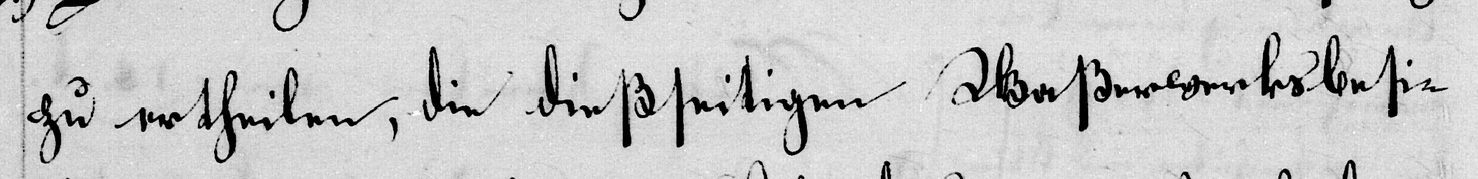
zu ertheilen, die dießseitigen Waßerwerksbesi¬
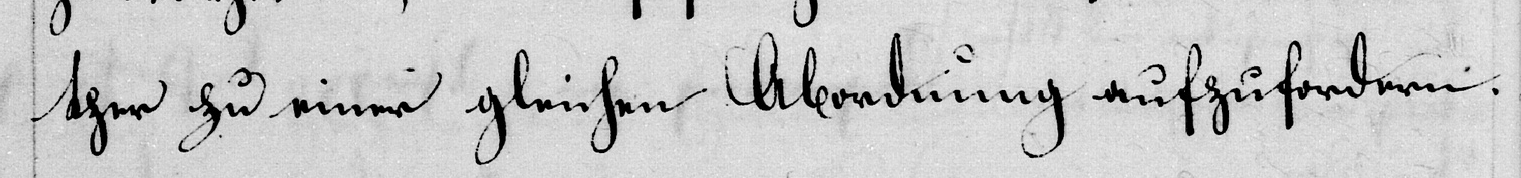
tzer zu einer gleichen Abordnung aufzufordern.
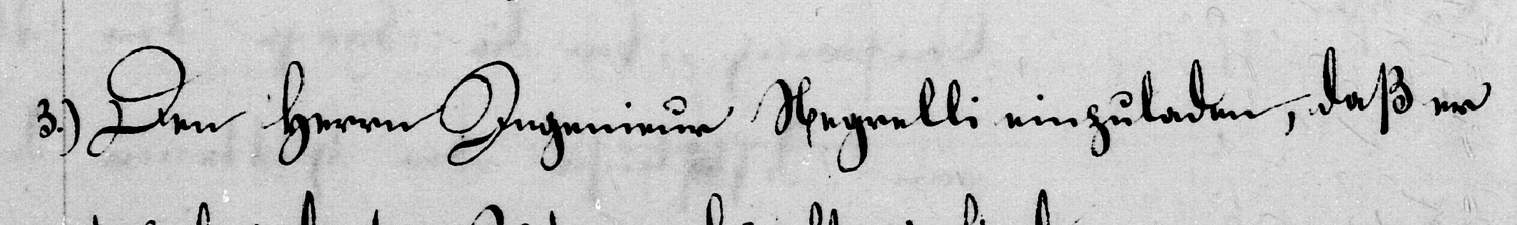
3.) Den Herrn Ingenieur Negrelli einzuladen, daß er
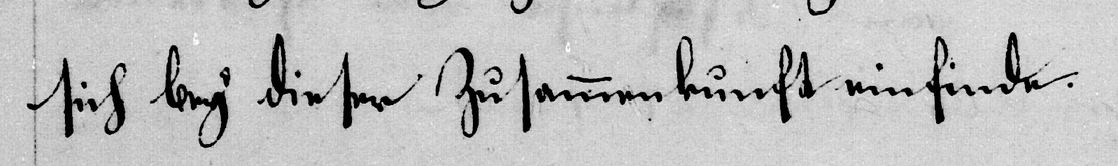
sich bey dieser Zusammenkunft einfinde.
